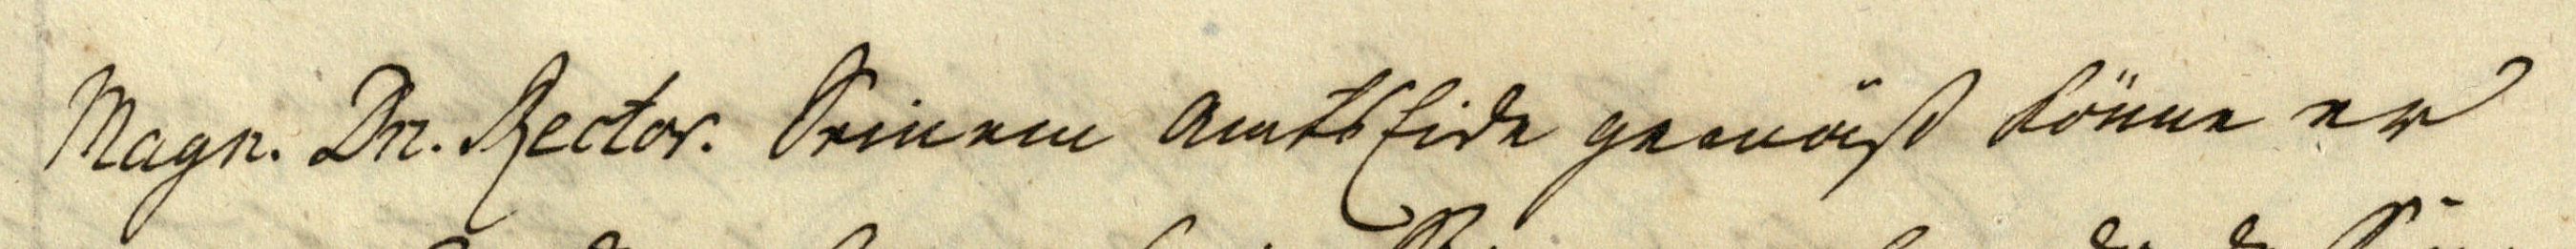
Magn. Dn. Rector. Seinem Amts Eide gemäß könne er
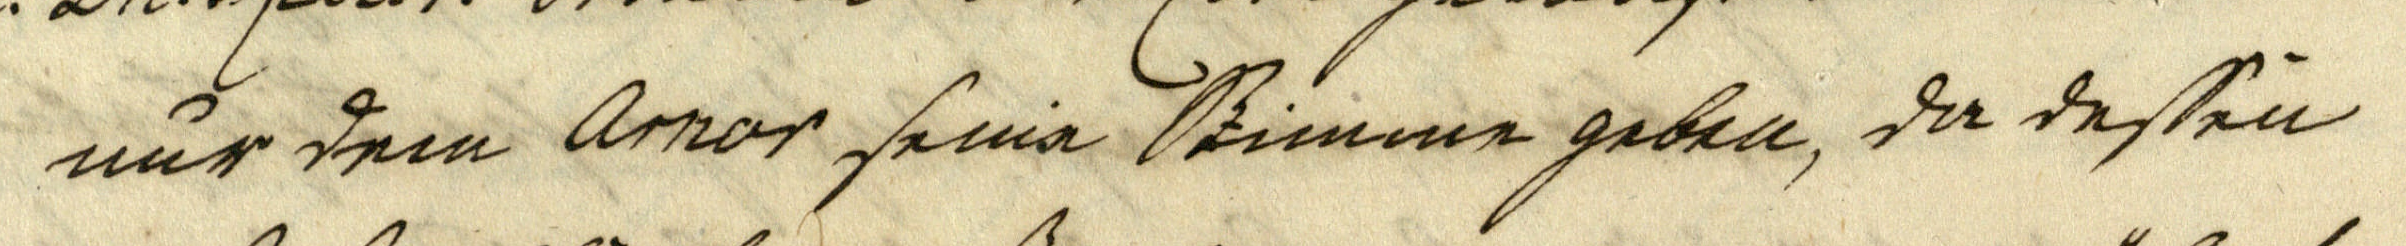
nur dem Amor seine Stimme geben, da dessen
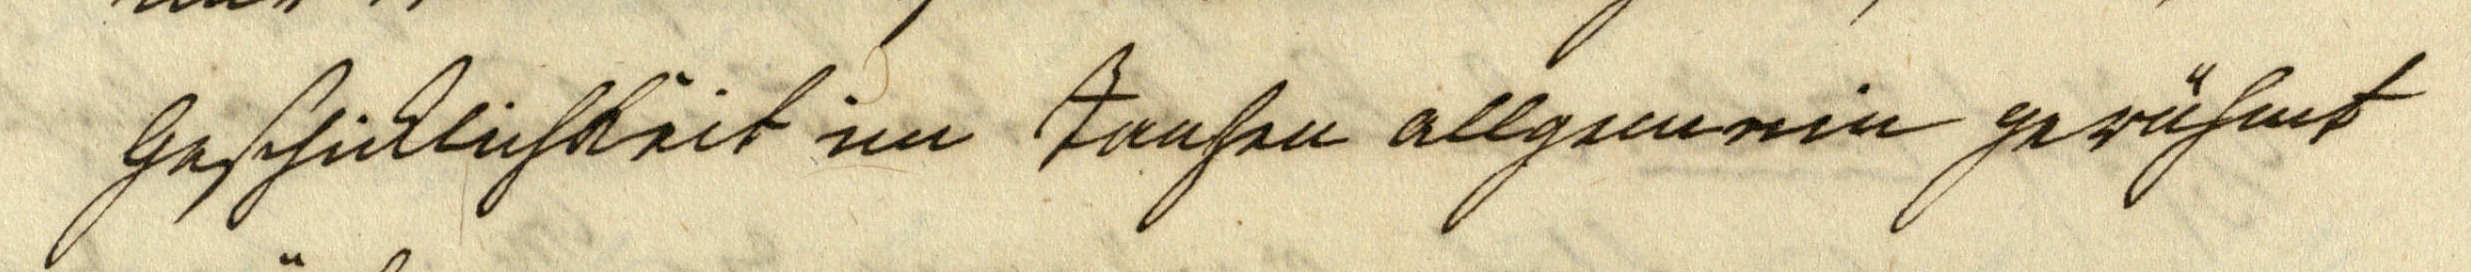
Geschicklichkeit im Tanzen allgemein gerühmt
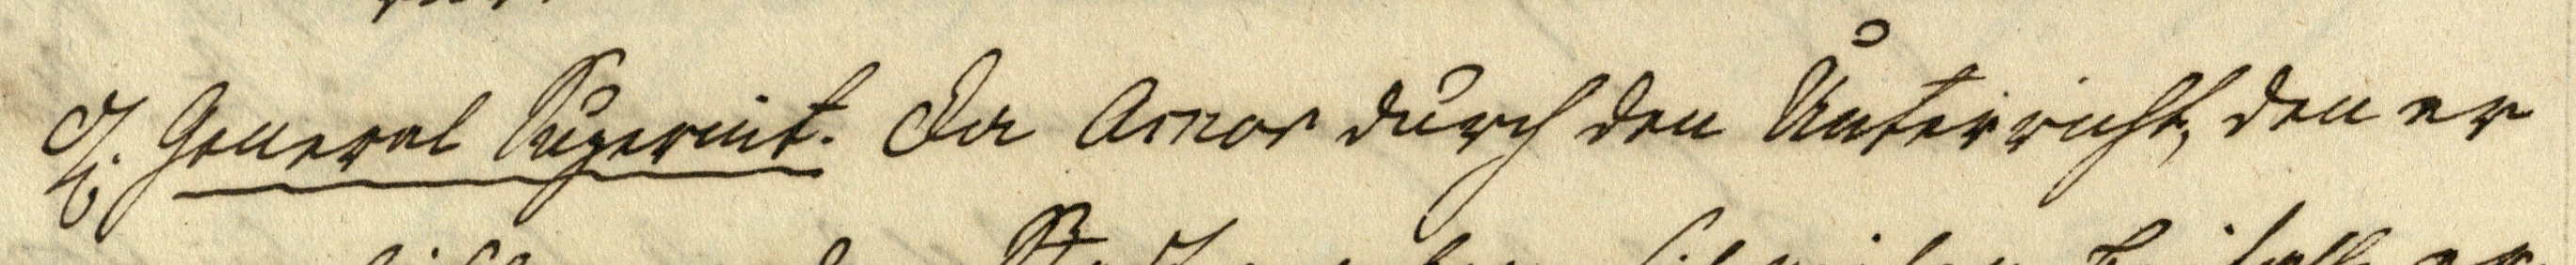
dh. General Superint. Da Amor durch den Unterricht, den er
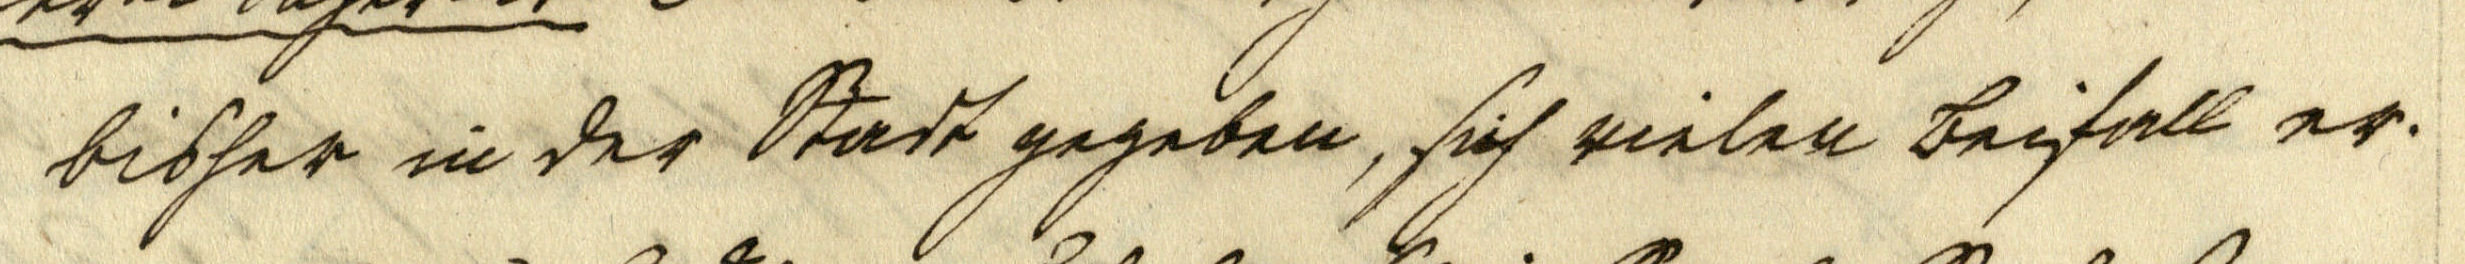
bisher in der Stadt gegeben, sich vielen Beifall er-
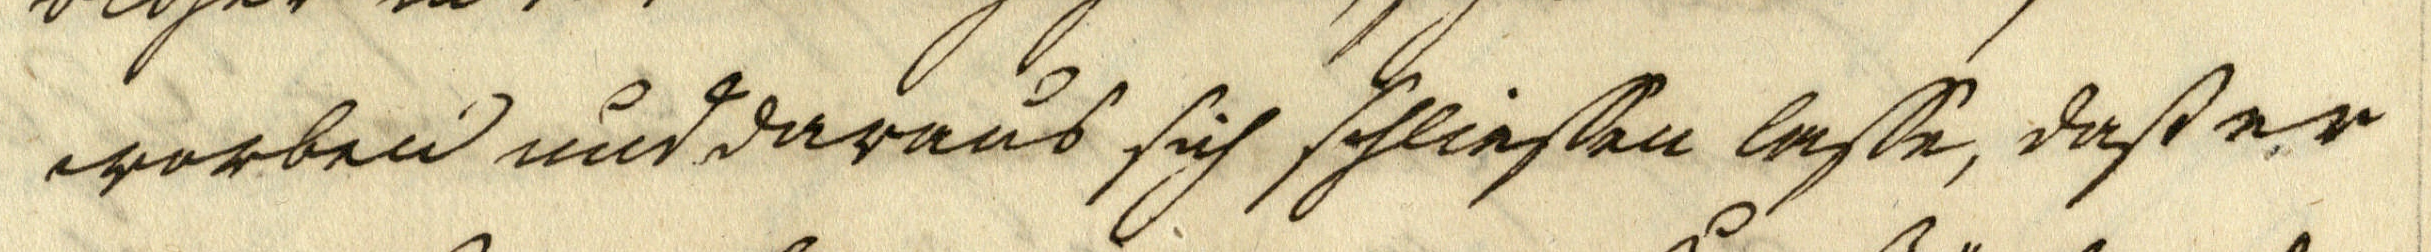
worben und daraus sich schliessen lasse, daß er
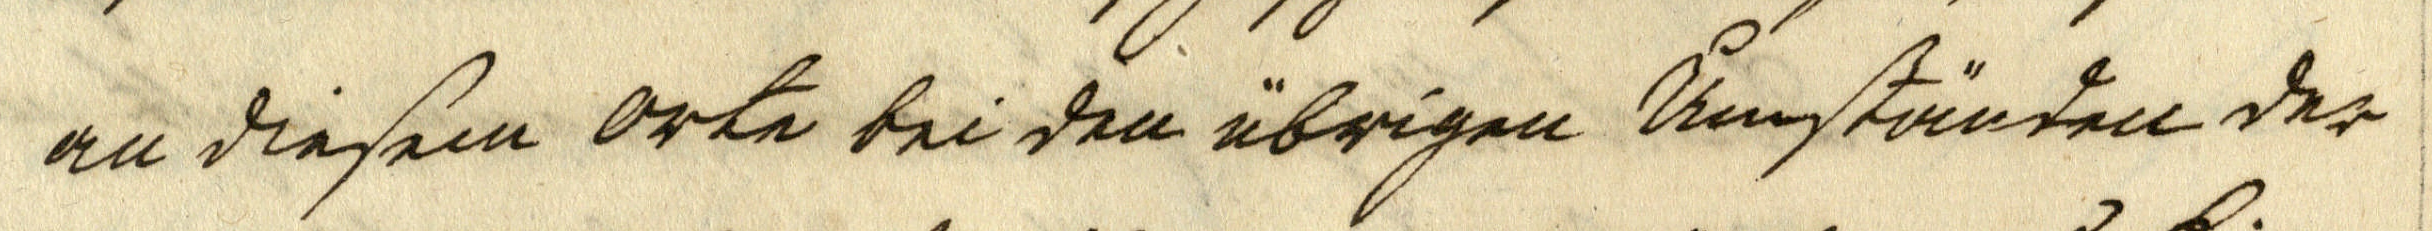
an diesem Orte bei den übrigen Umständen der
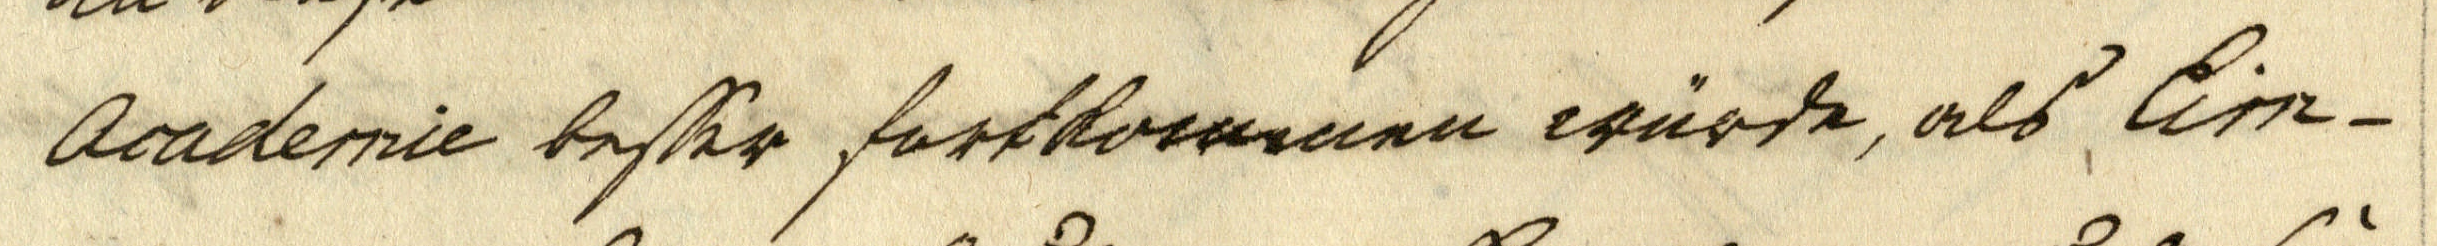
Academie besser fortkommen würde, als Eim-
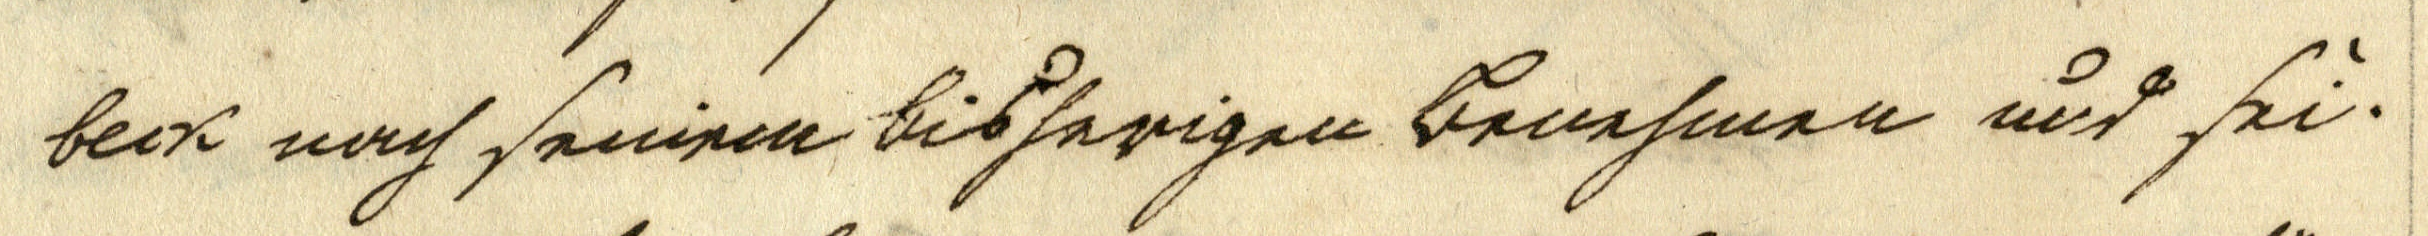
beck nach seinem bisherigen Benehmen und sei-
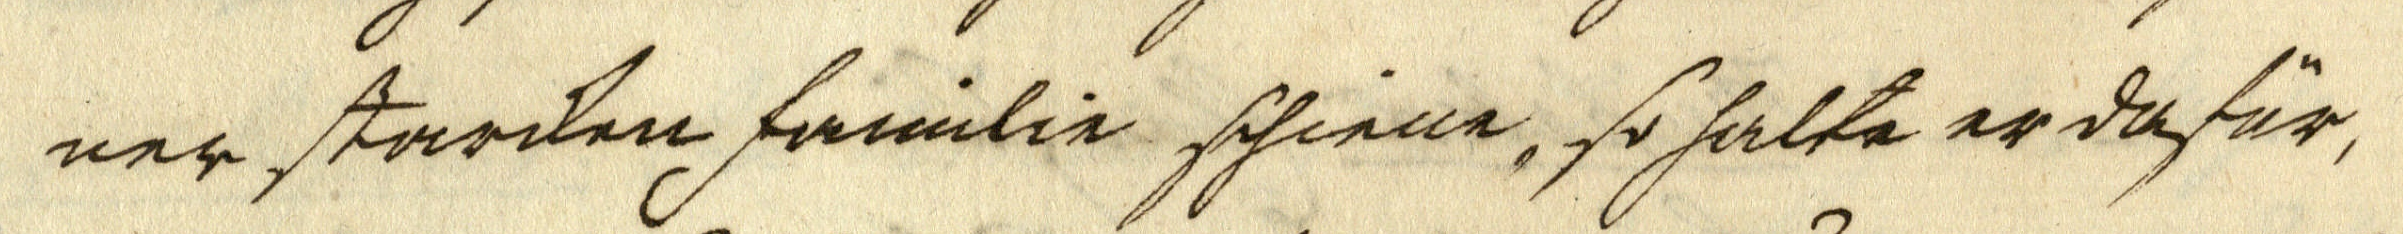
ner starken Familie schiene, so halte er dafür,
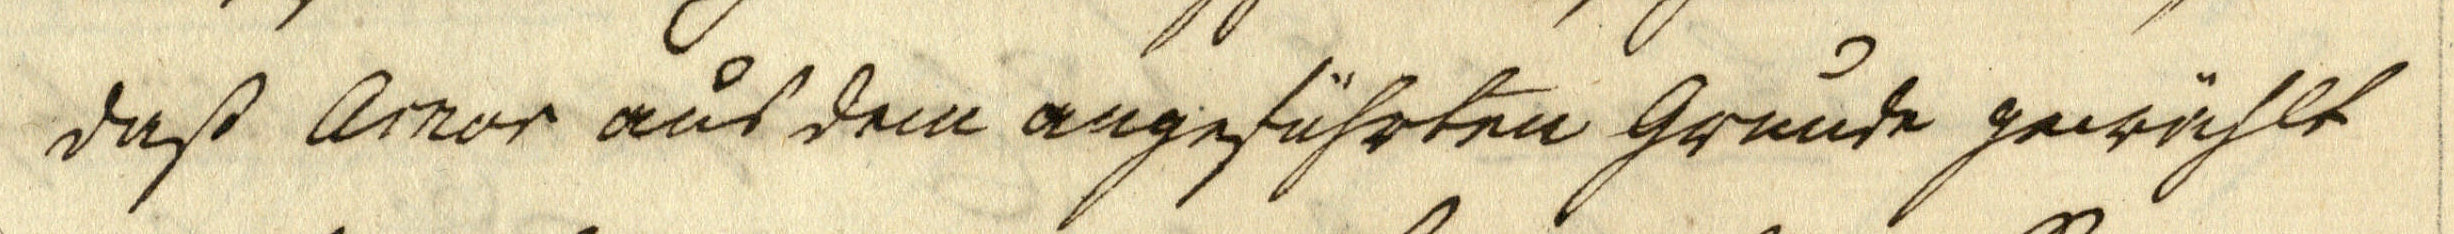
daß Amor aus dem angeführten Grunde gewählt
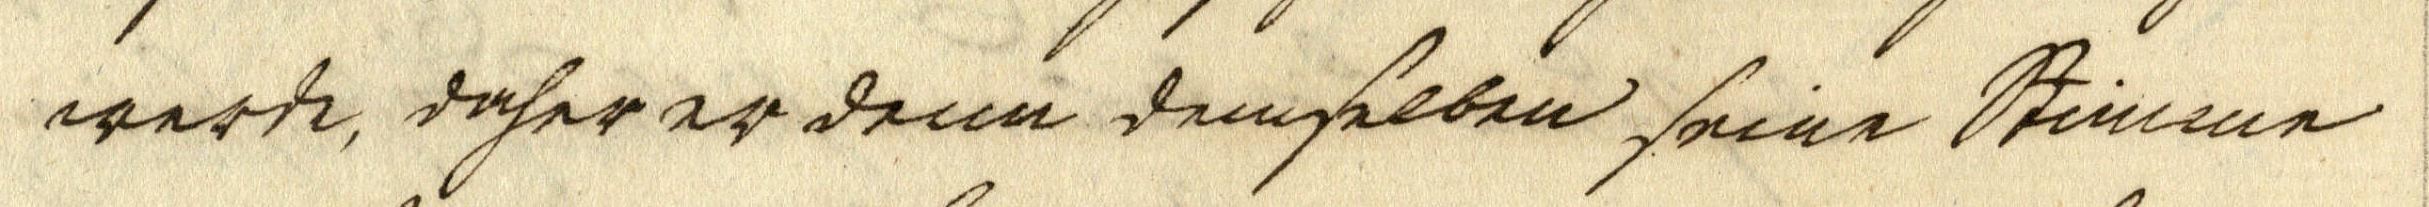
werde, daher er denn demselben seine Stimme
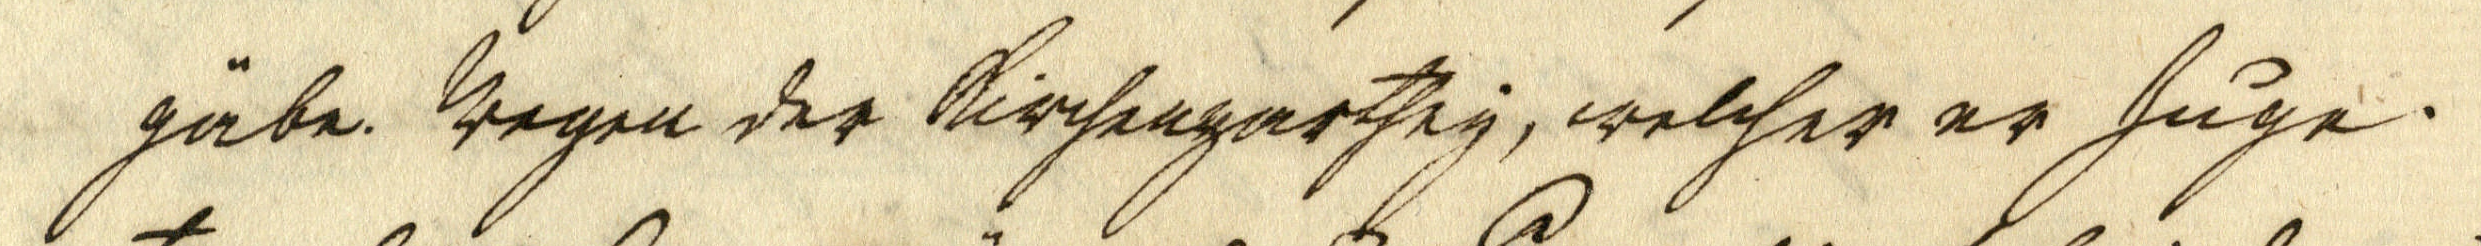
gäbe. Wegen der Kirchenparthey, welcher er zuge-
